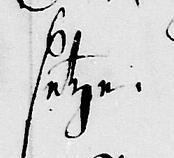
tze.
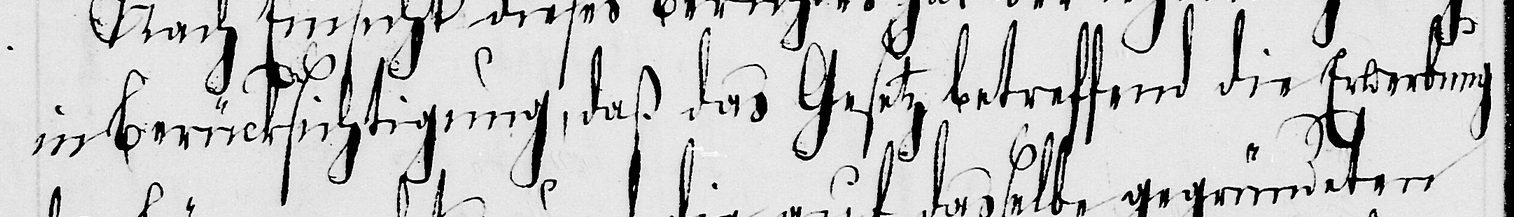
in Berücksichtigung, daß das Gesetz betreffend die Erwerbung
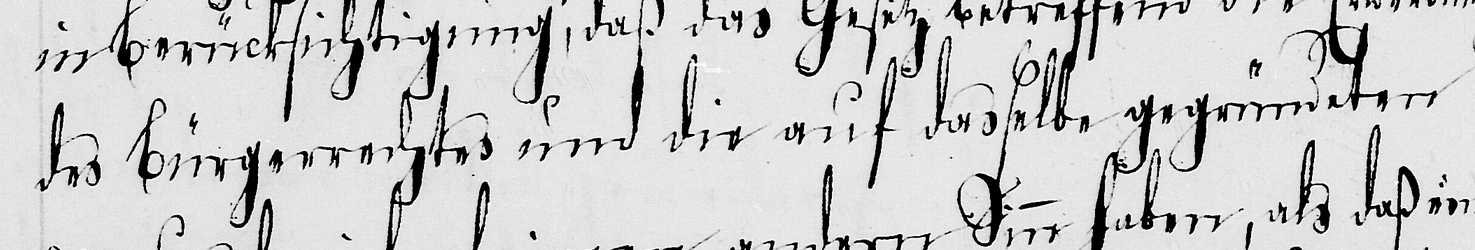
des Bürgerrechtes und die auf dasselbe gegründeten
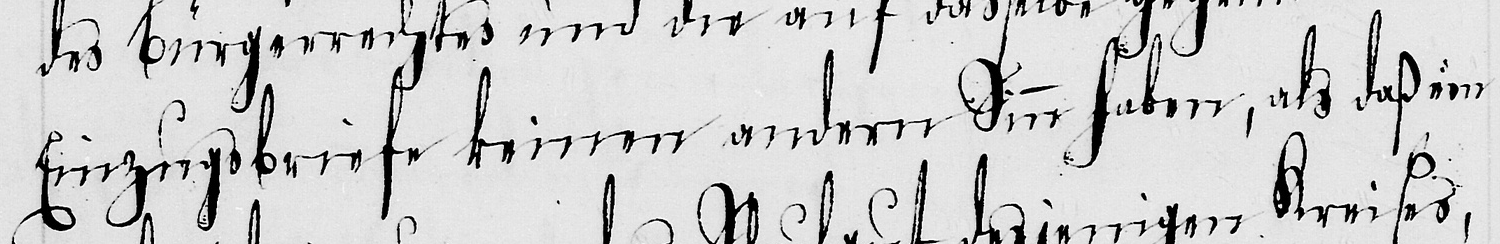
Einzugsbriefe keinen andern Sinn haben, als daß ein
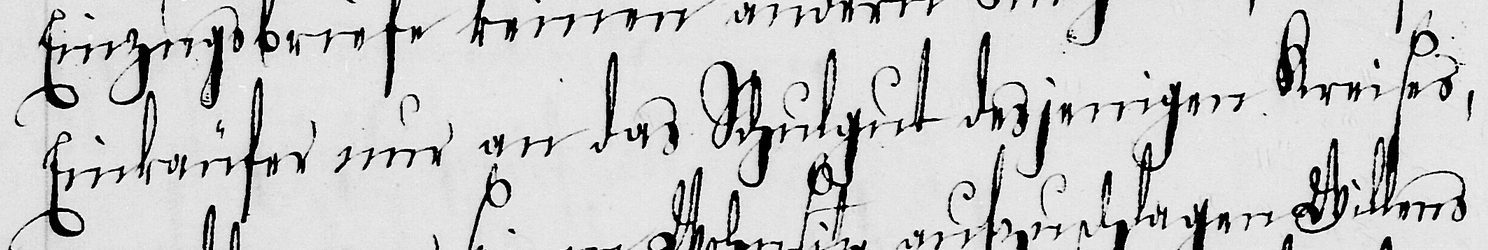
Einkäufer nur an das Schulgut desjenigen Kreises,
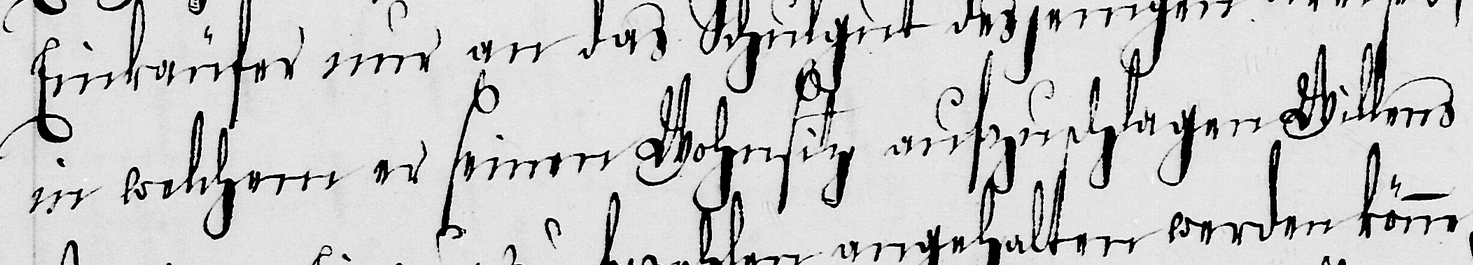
in welchem er seinen Wohnsitz aufzuschlagen Willens
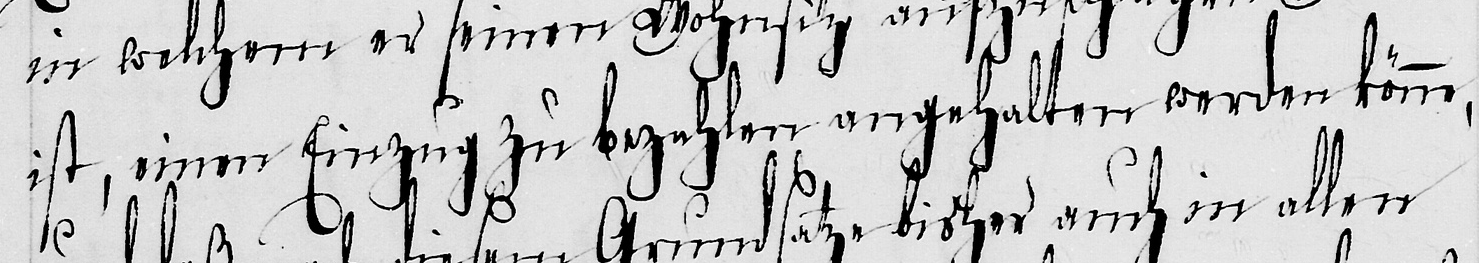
ist, einen Einzug zu bezahlen angehalten werden könn¬
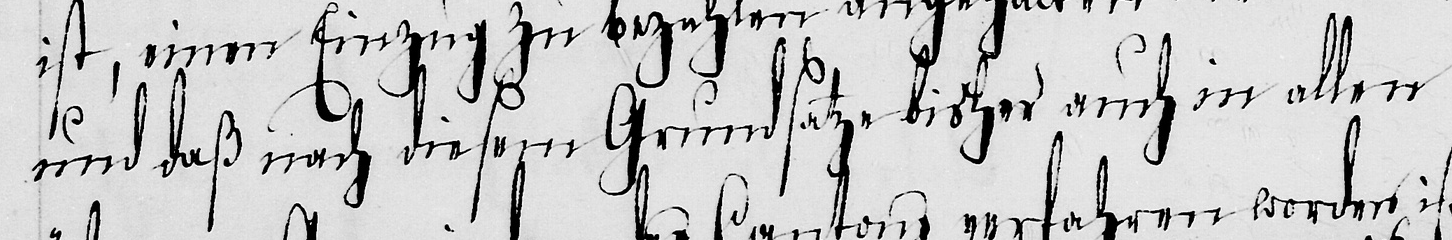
und daß nach diesem Grundsatze bisher auch in allen
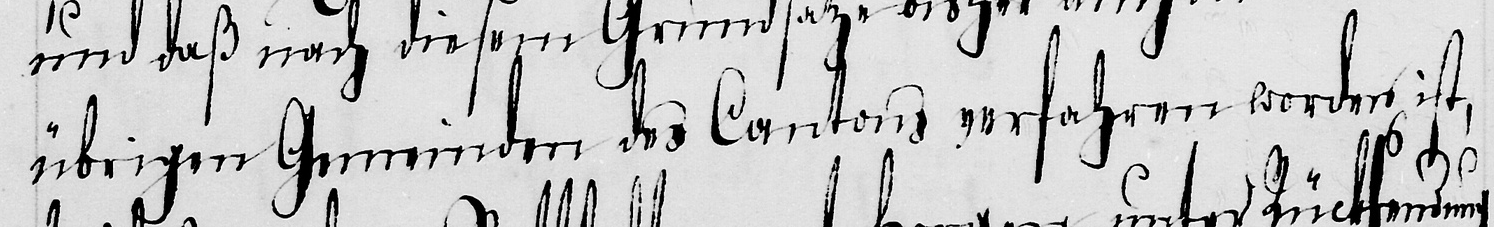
übrigen Gemeinden des Cantons verfahren worden ist,
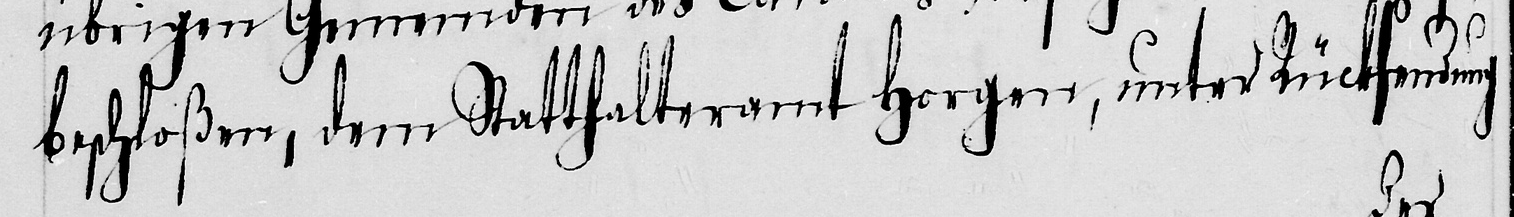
beschloßen, dem Statthalteramt Horgen, unter Rückforde¬
